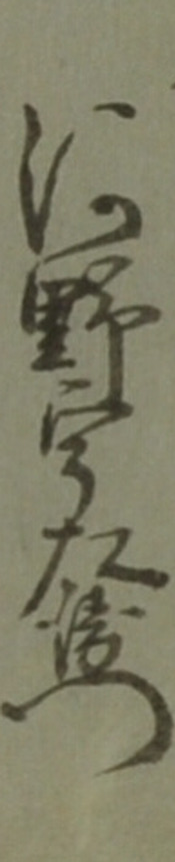河野宇左衛門
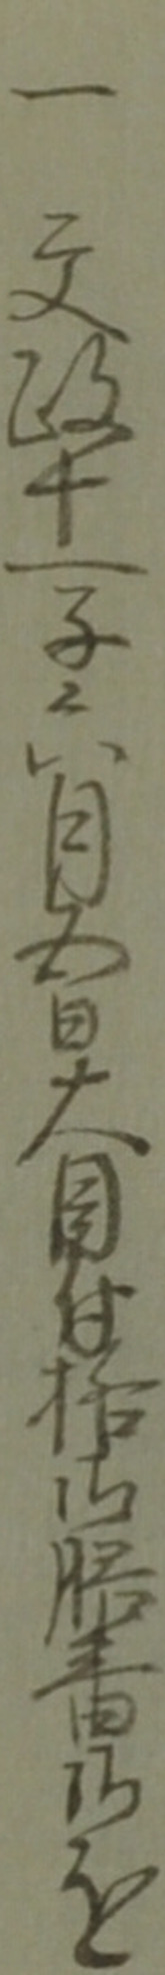一文政じ十一子六月五日大目付格御膳番御近
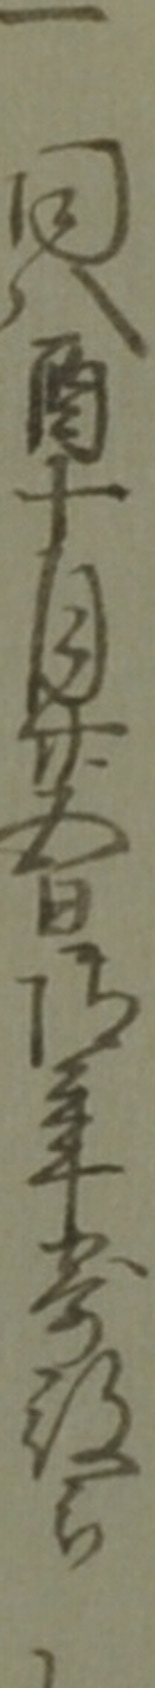一同八酉十月廿五日御年寄被仰付之
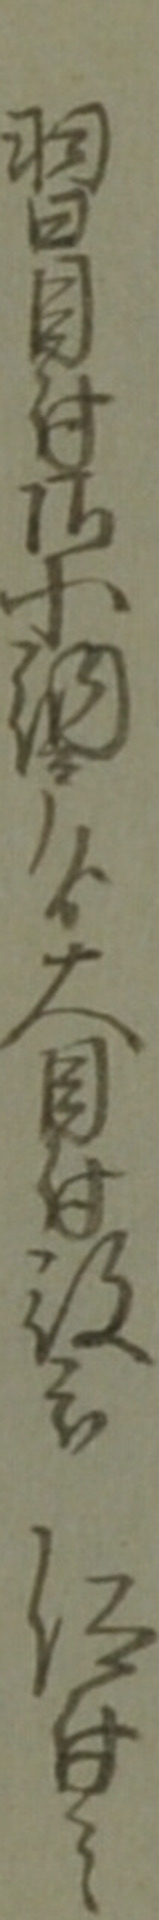習目付御小納戸ゟ大目付役被仰付之
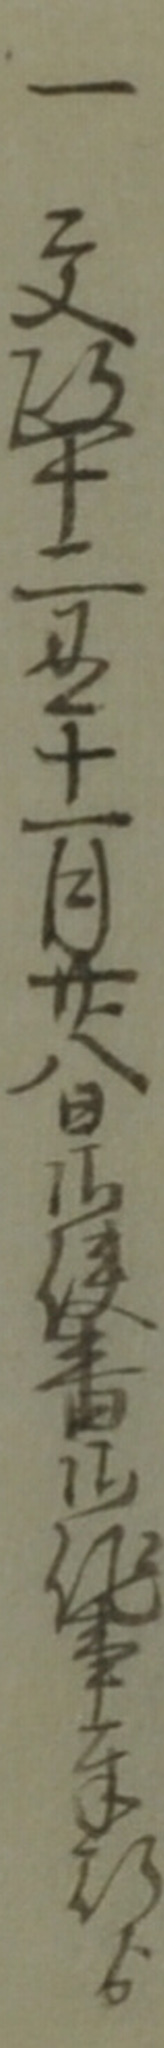一文政十二丑十一月廿八日御使番御作事奉行ゟ
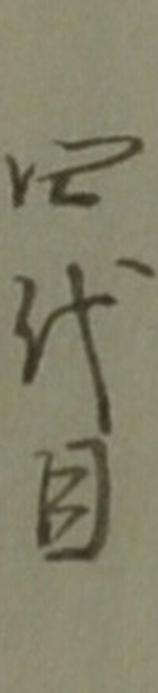四代目
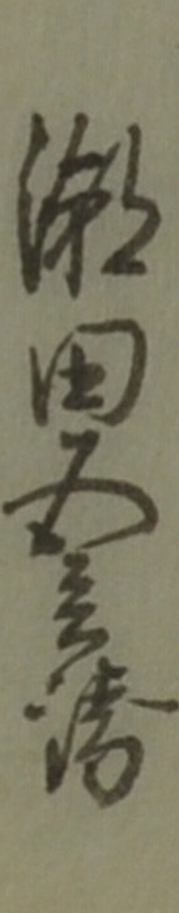潮田五兵衛
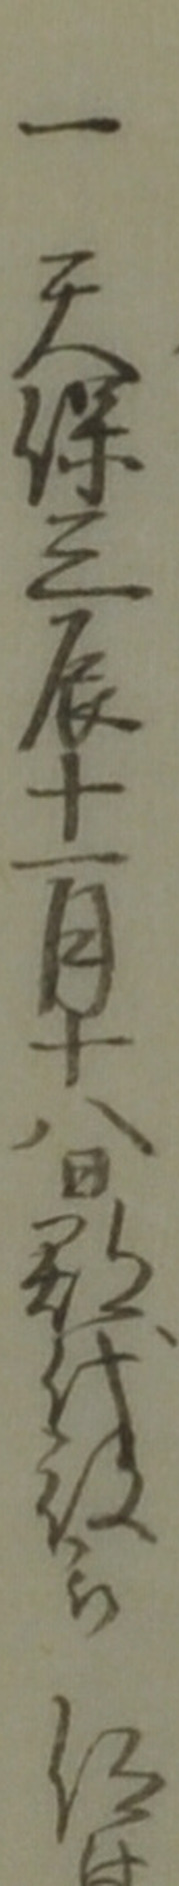一天保三辰十一月十八日郡代役被仰付之
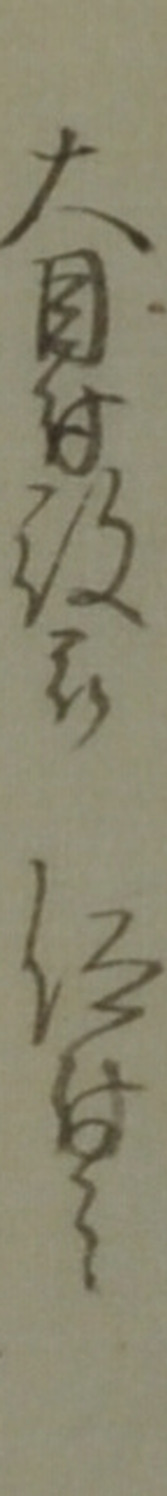大目付役被仰付之
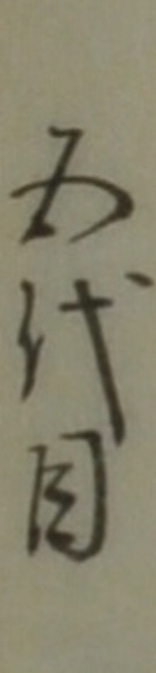五代目
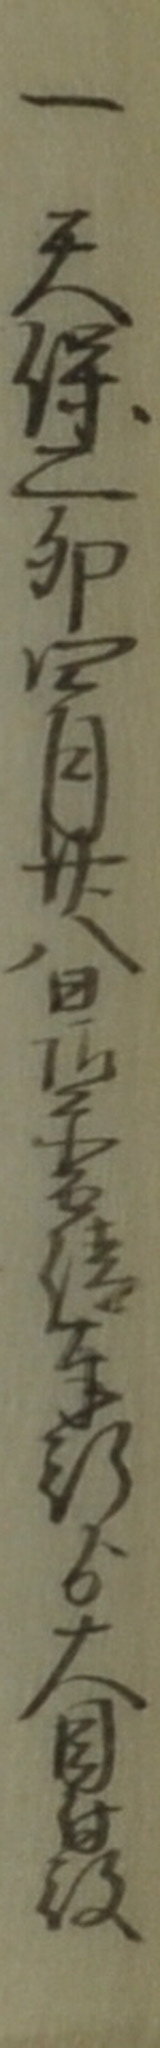一天保二卯四月廿八日御普請奉行ゟ大目付役
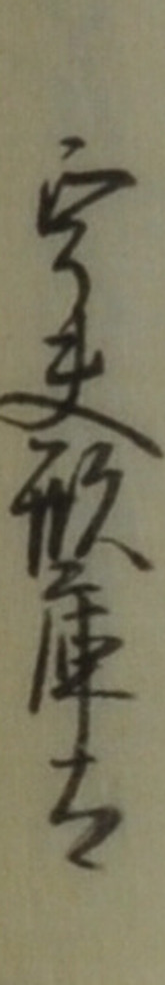宇夫形庫太
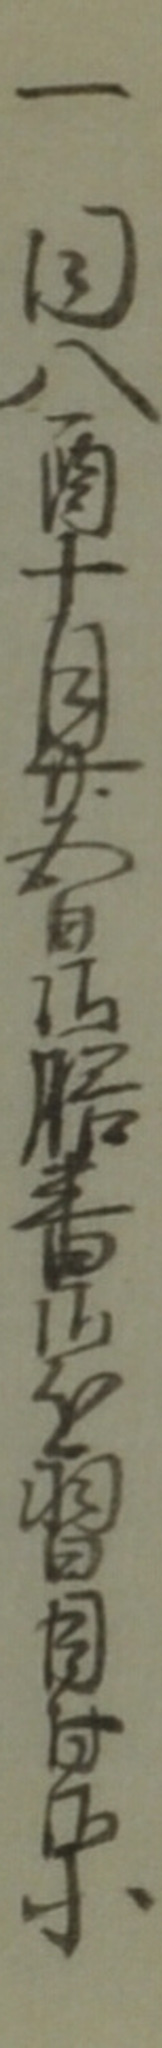一同八酉十月廿五日御膳番御近習目付御小
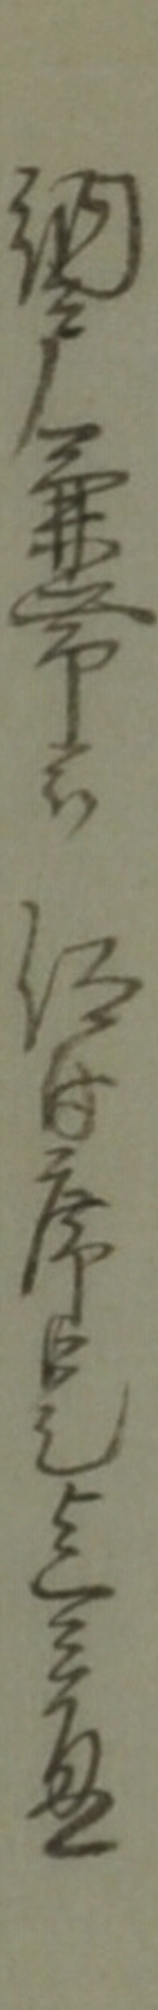納戸兼帯被仰付席是迄之通
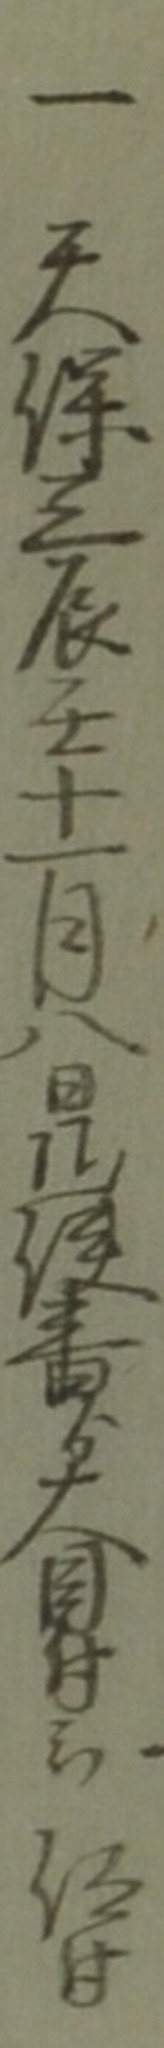一天保三辰閏十一月八日御使番ゟ大目付被仰付
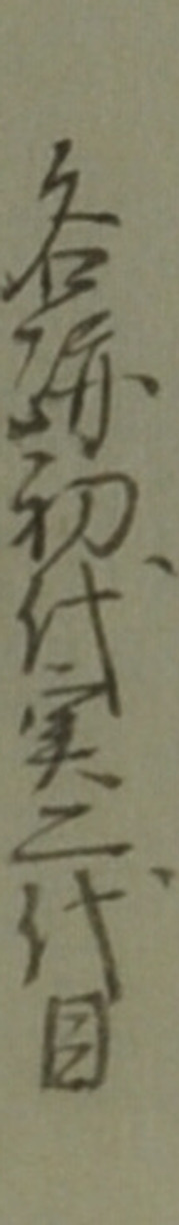名跡初代実二代目
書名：諸御役代々録（三）
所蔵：伊那市立高遠町図書館・合同会社AMANE
